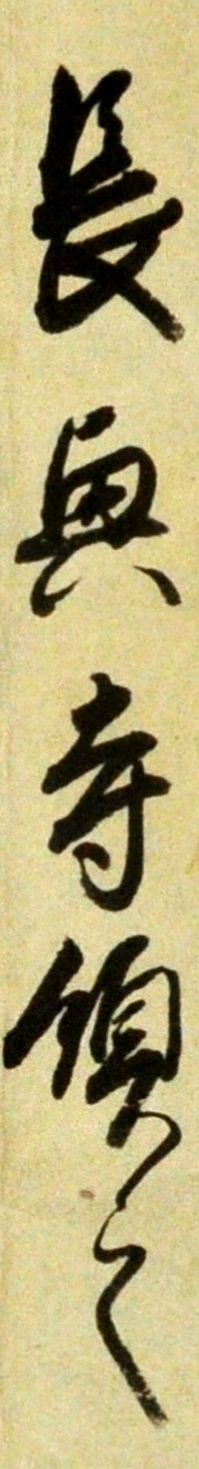長興寺領之
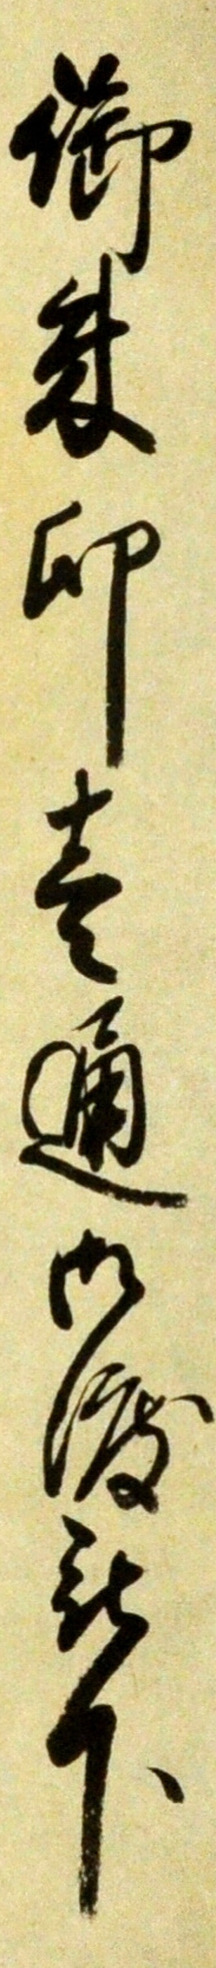御朱印壱通御渡被下
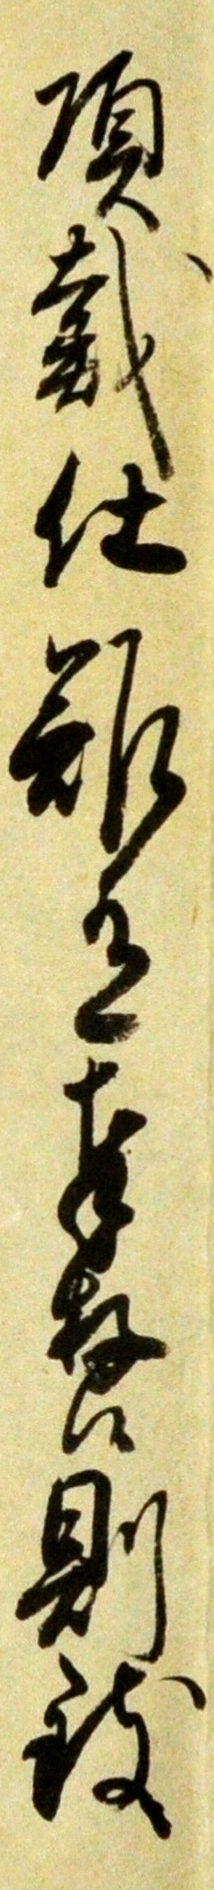頂戴仕難有奉存候則致
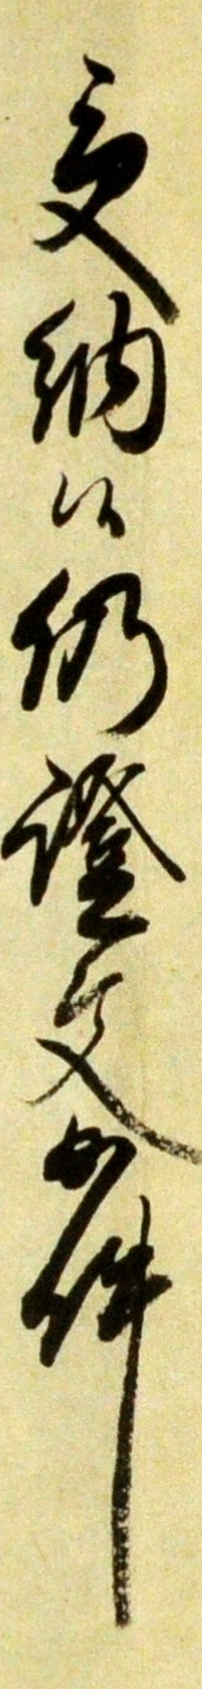受納候仍証文如件
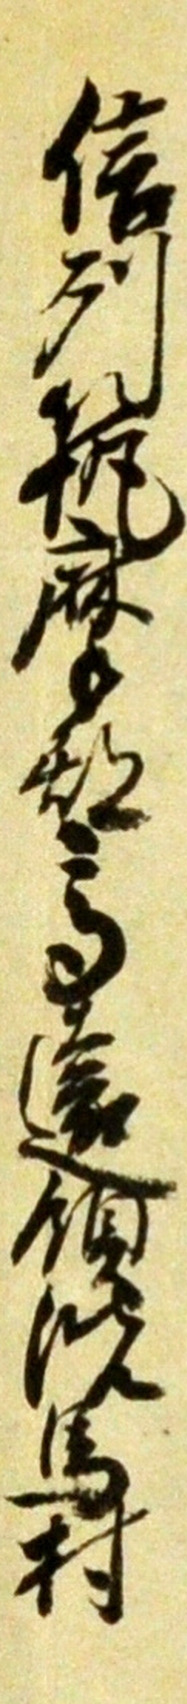信州筑摩郡高遠領洗馬村
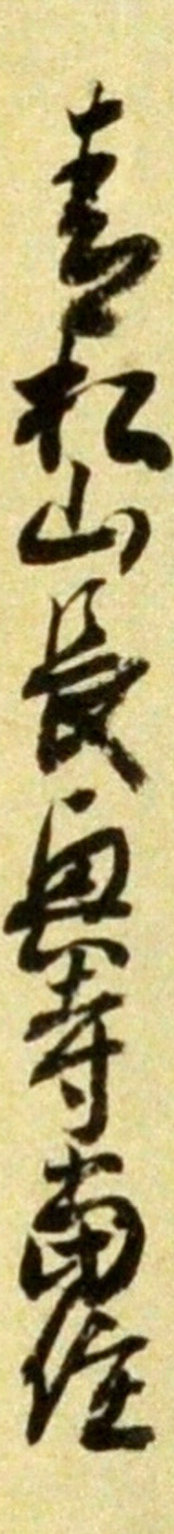青松山長興寺当住
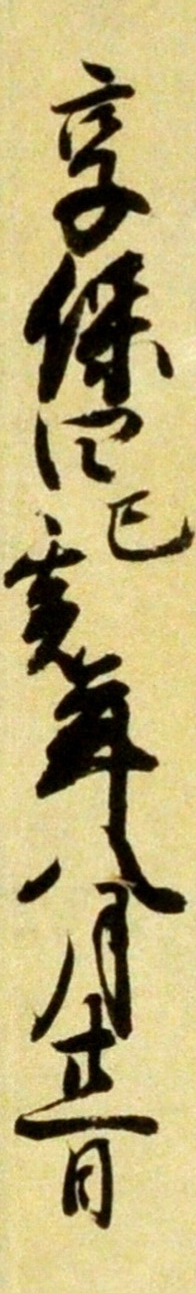享保四己亥年八月廿一日
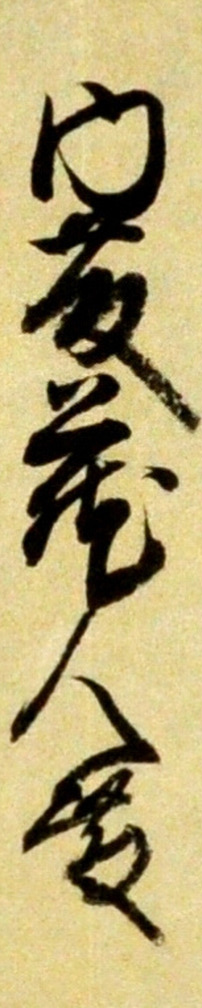内藤蔵人殿

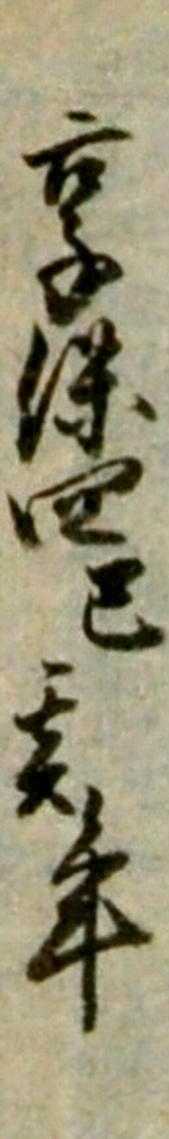享保四己亥年
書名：証文
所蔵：伊那市立高遠町図書館・合同会社AMANE
